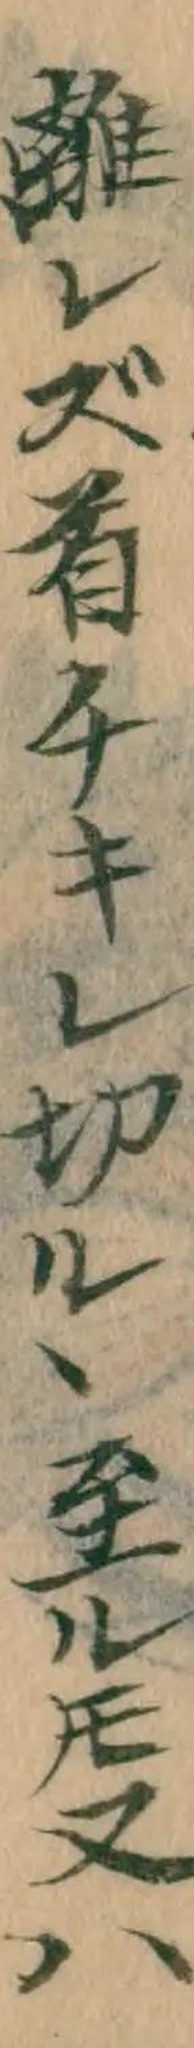離レズ首チキレ切ルヽ至ルトモ又ハ
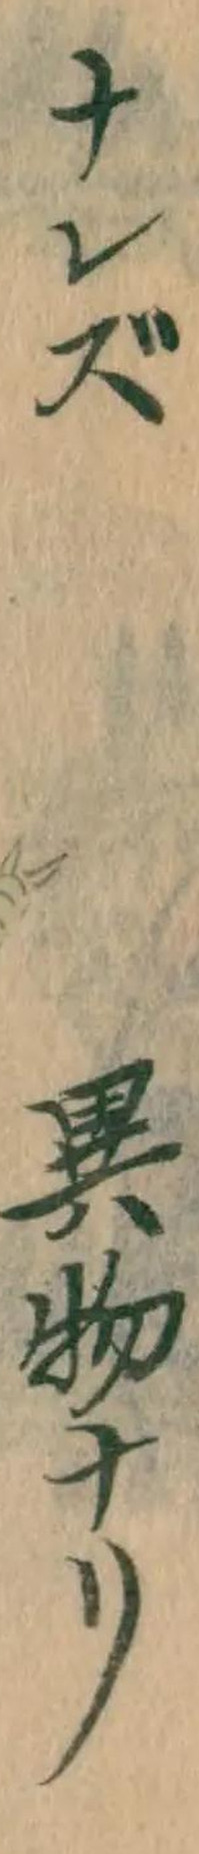ナレズ異物ナリ

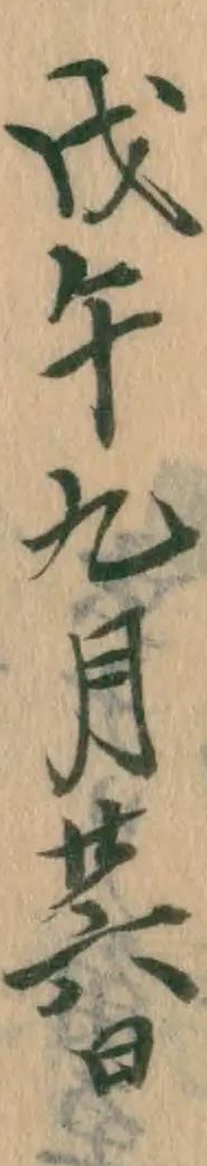戊午九月廿六日
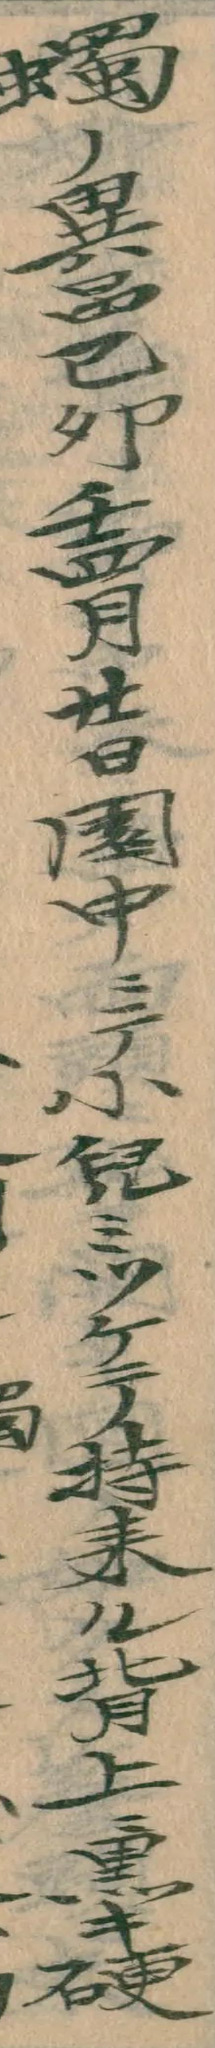蠋ノ異品己卯閏四月廿日園中ニテ小児ミツケテ持来ル背上ニ黒キ硬
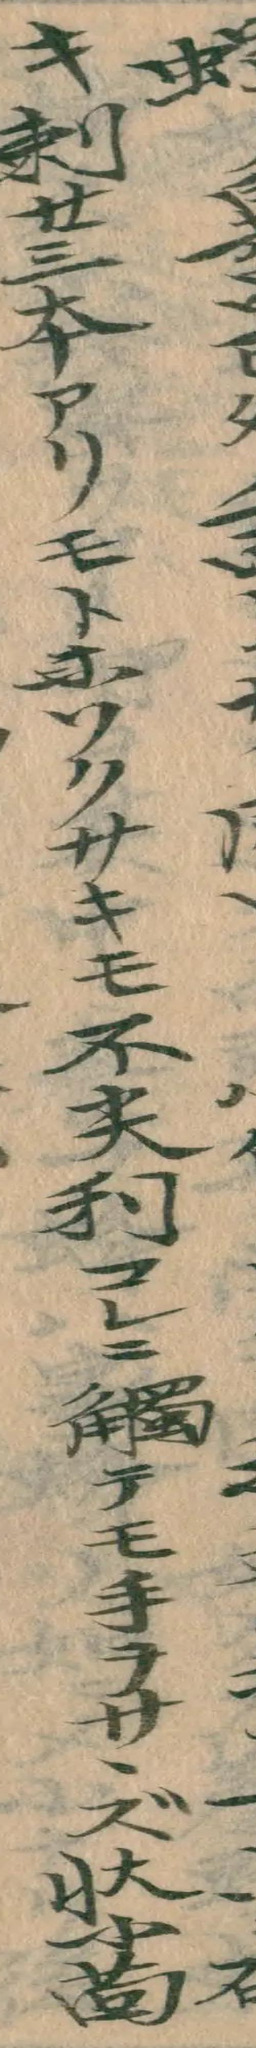キ刺廿三本アリモトホソクサキ不尖利コレニ觸テモ手ヲサヽズ状小茴
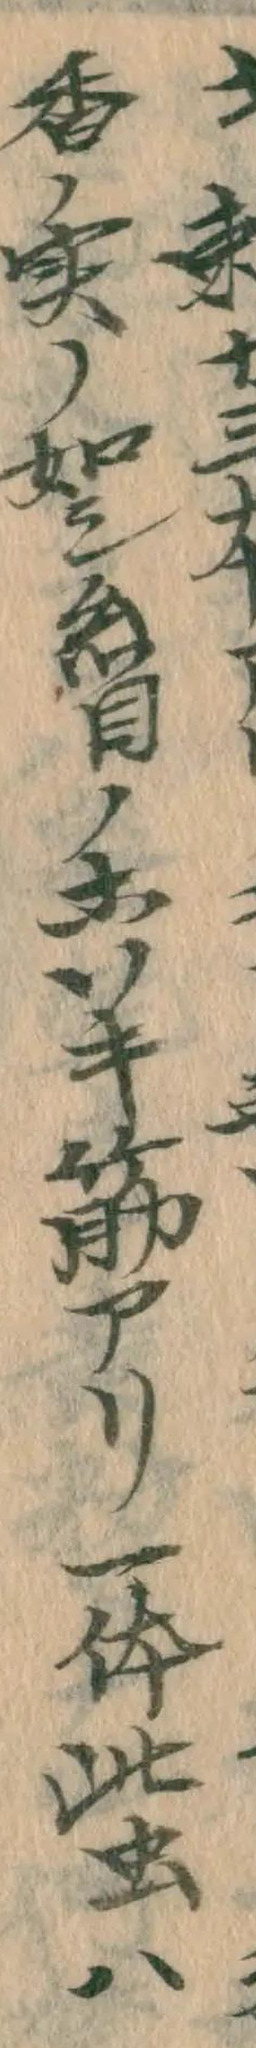香ノ実ノ如シ糸目ノホソキ筋アリ一体此虫ハ
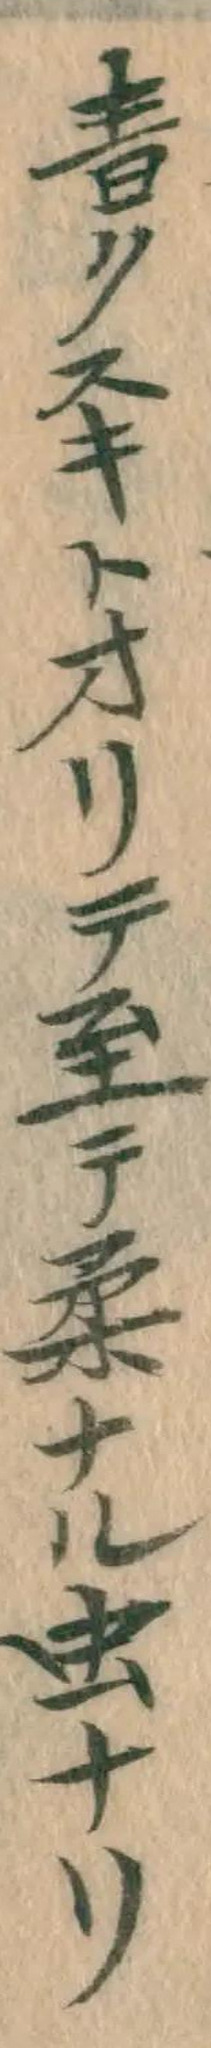青クスキトオリテ至テ柔ナル虫ナリ

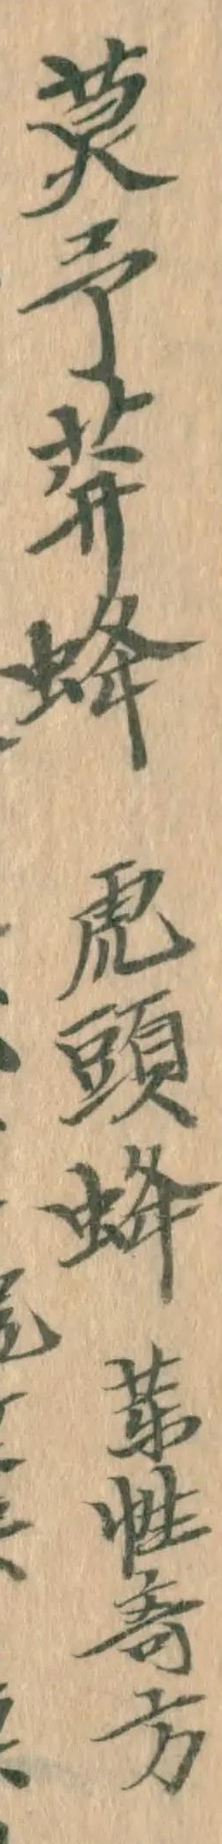莫予莽蜂虎頭蜂薬性奇方
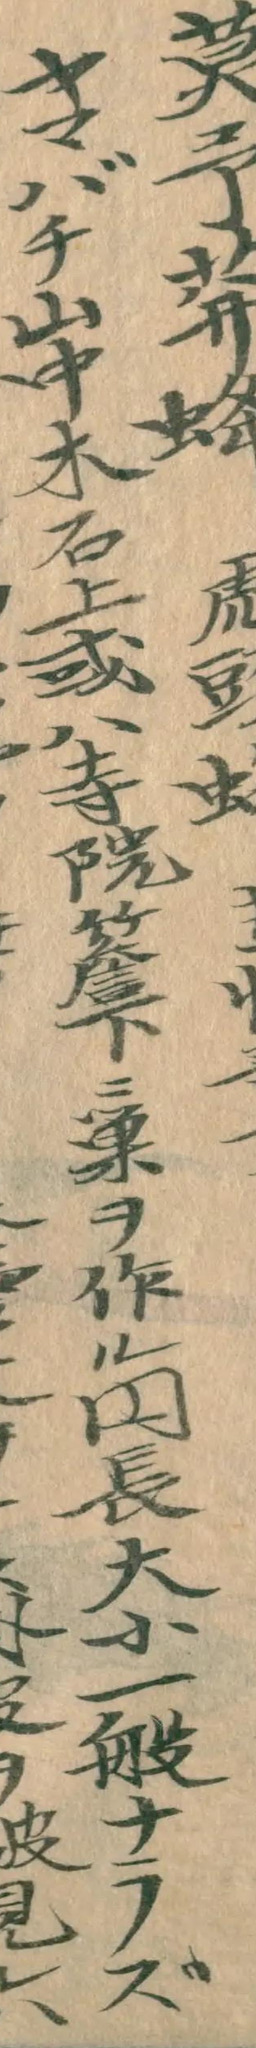ヤマバチ山中木石上或ハ寺院簷下ニ巣ヲ作ル円長大小一般ナラズ
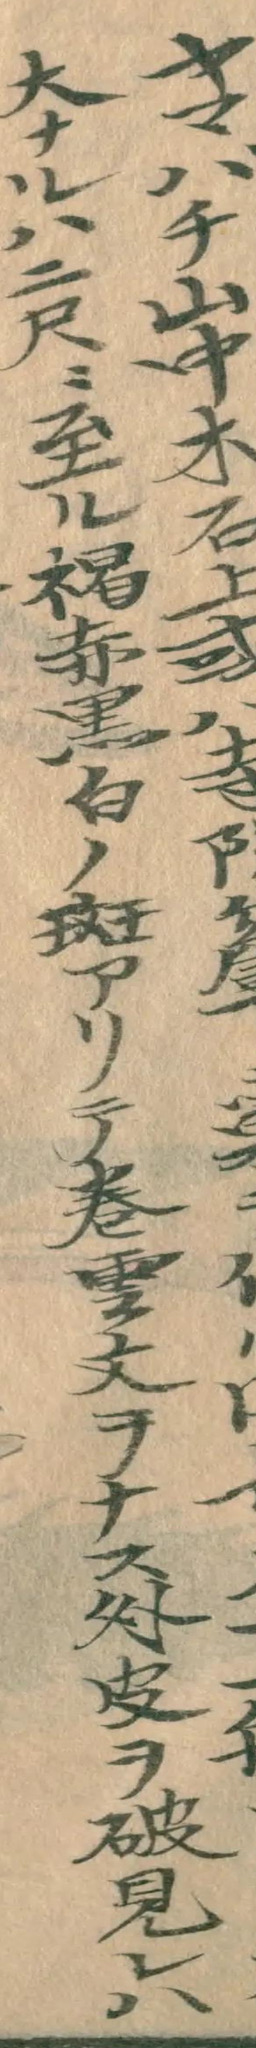大ナルハ二尺ニ至ル褐赤黒白ノ斑アリテ巻雲文ヲナス外皮ヲ破見レハ
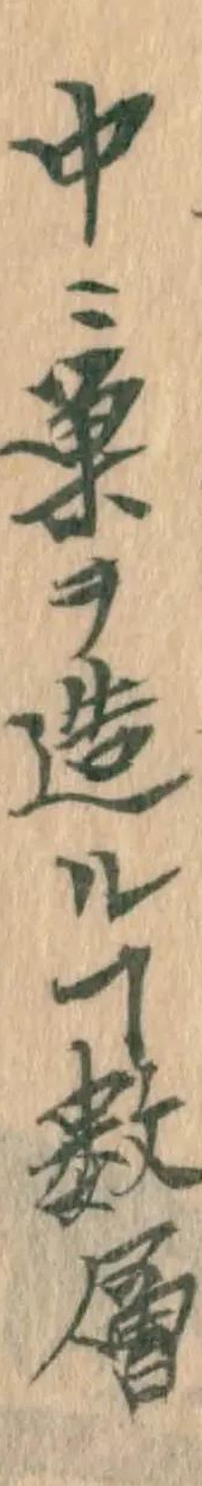中ニ巣ヲ造ルコト数層
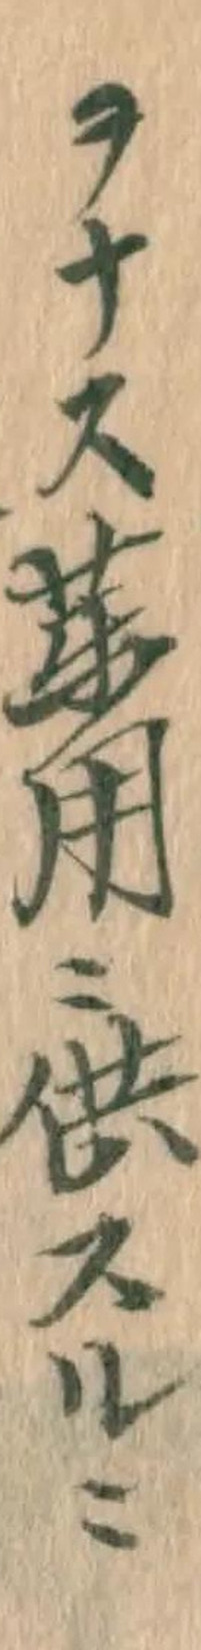ヲナス薬用ニ供スルニ
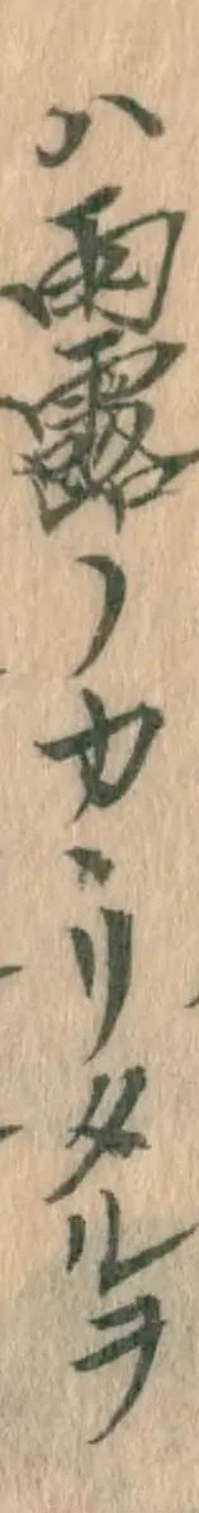ハ雨露ノカヽリタルヲ
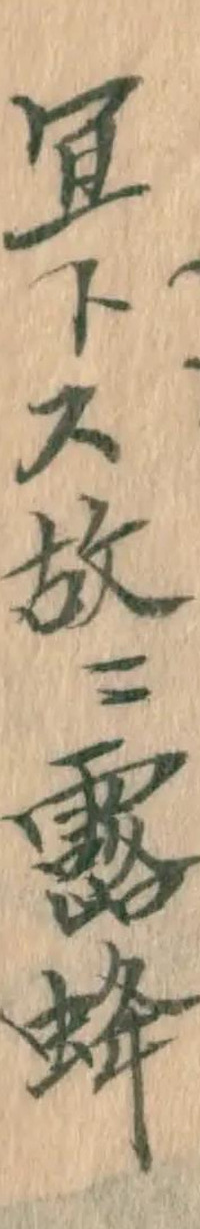宜トス故ニ露蜂
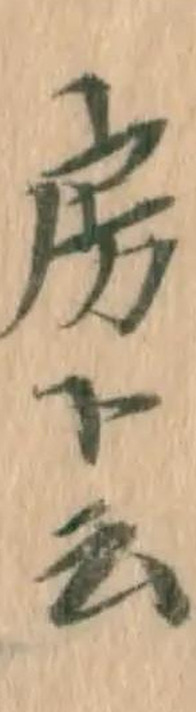房ト云
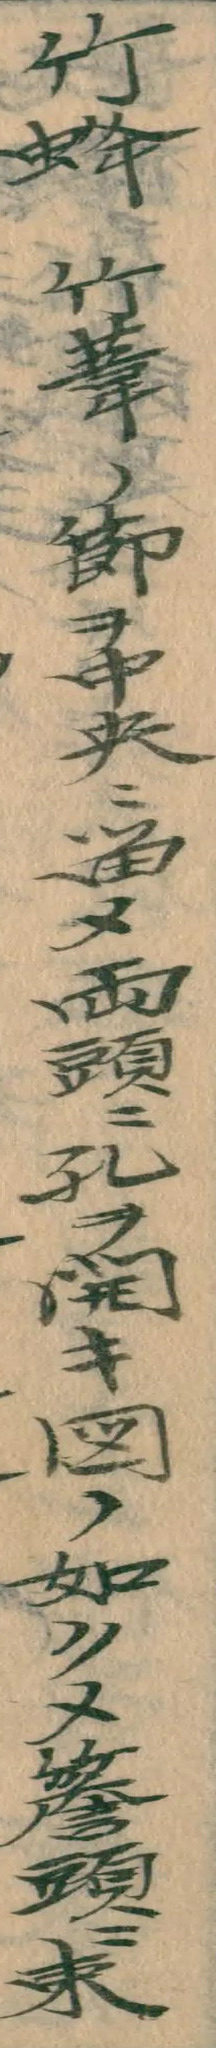竹蜂竹葦ノ節ヲ中央ニメ両頭ニ孔ヲ開キ図ノ如クシテ簷頭ニ束
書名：千蟲譜 3巻. [2]
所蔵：国立国会図書館 National Diet Library, JAPAN
